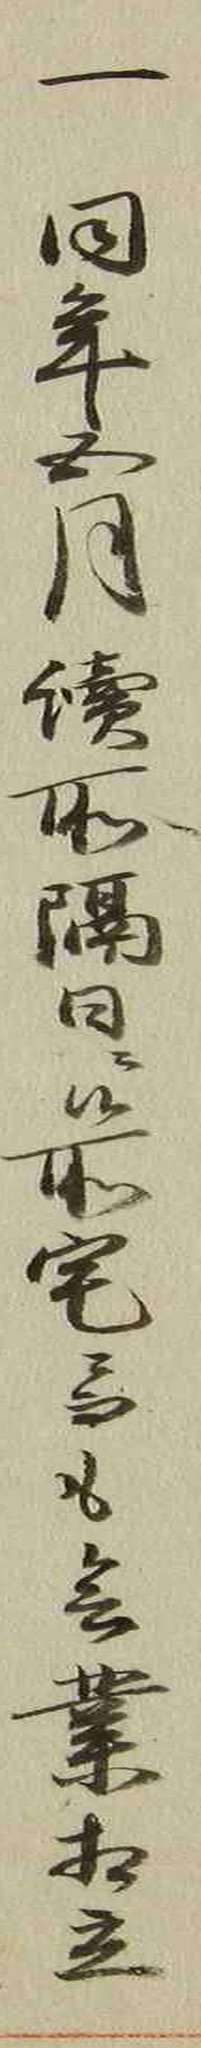一同年五月読所隔日に候所宅に而も会業相立
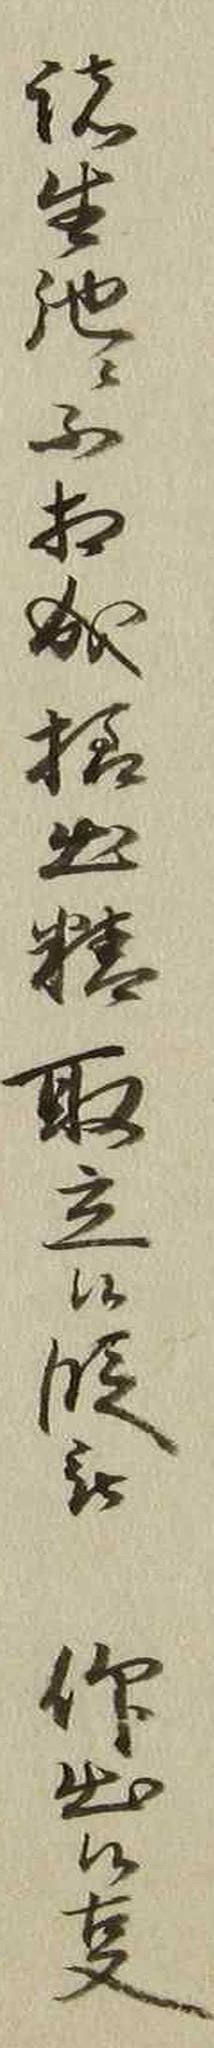諸生他に不相成様出精取立候段被仰出候事
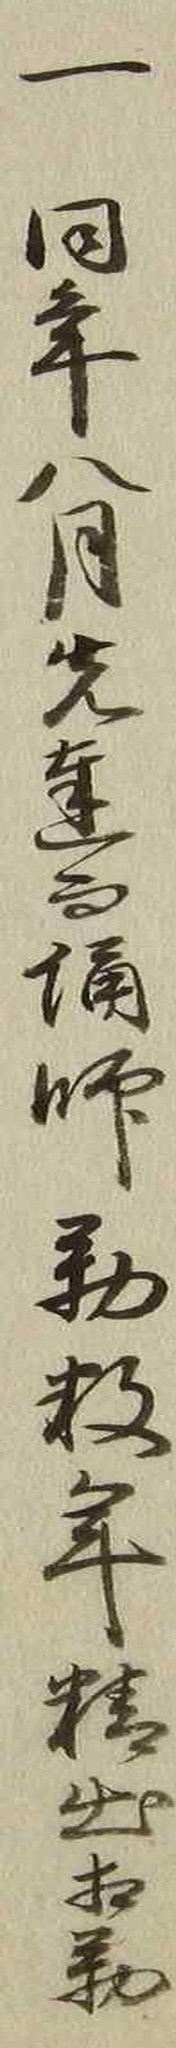一同年八月先達而誦師勤数年精出相勤
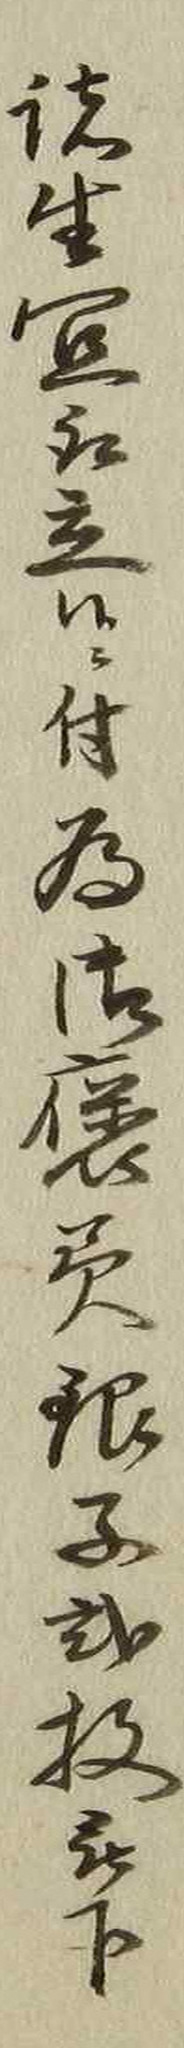諸生宜取立候に付為御褒美銀子弐枚被下
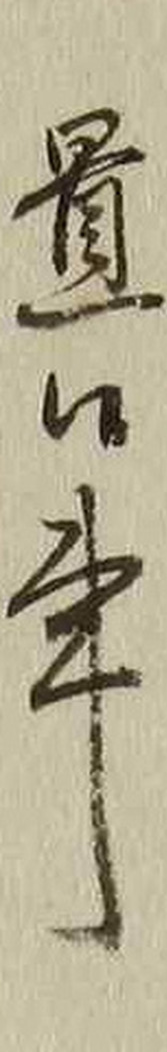置候事
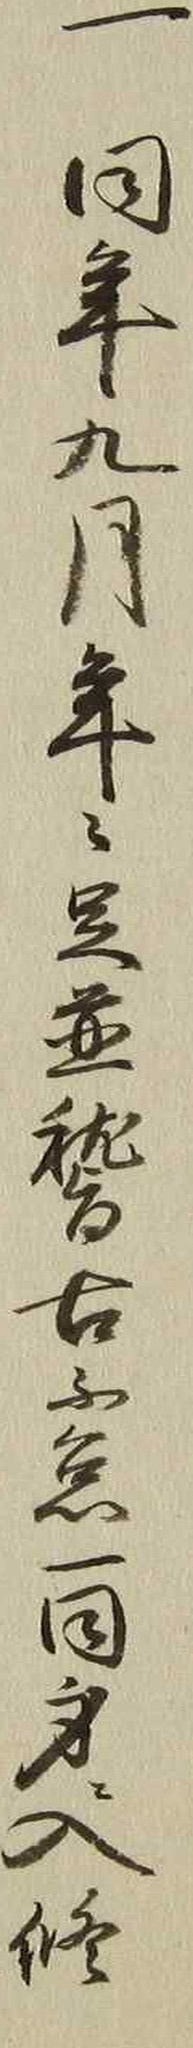一同年九月年々足並稽古不怠一同身に入修
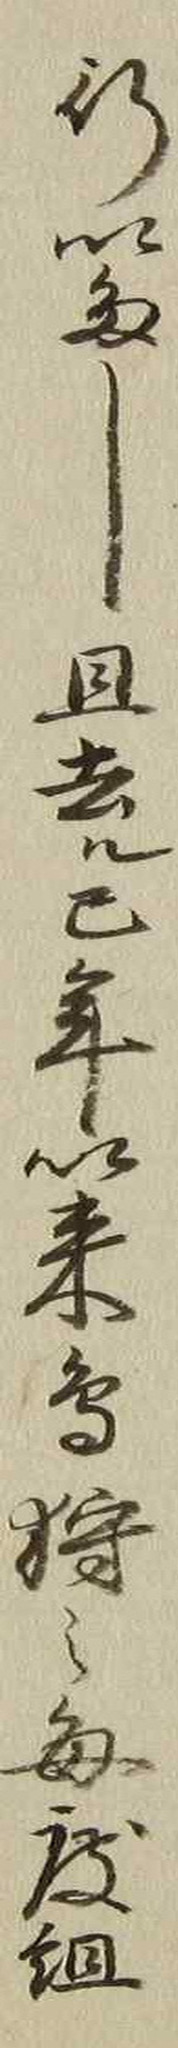行いたし且去ル己年以来鳥狩之毎度組
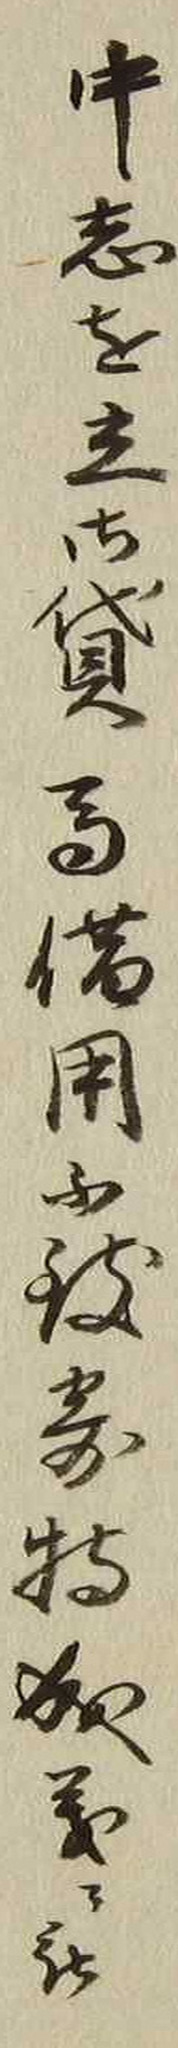中志を立御貸馬借用不致奇特成義に被
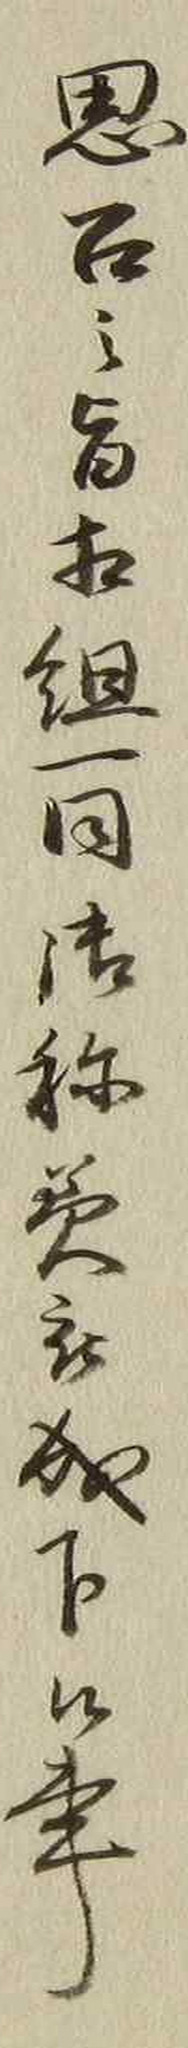思召之旨相組一同御称美被成下候事
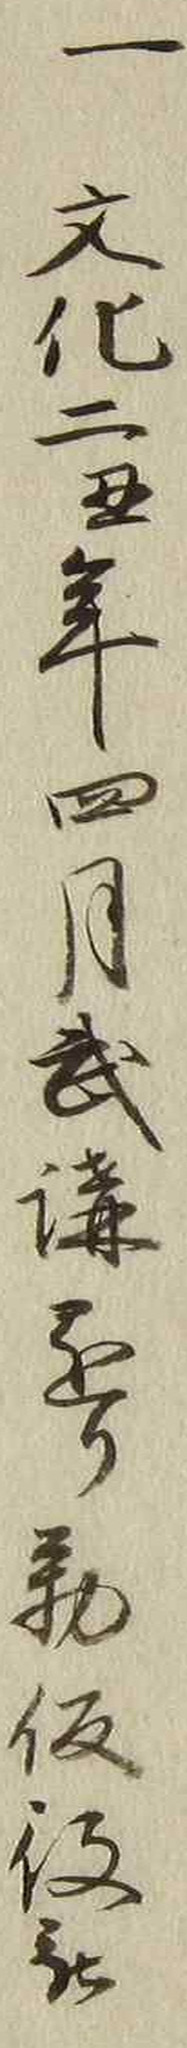一文化二丑年四月武講懸り勤仮役被
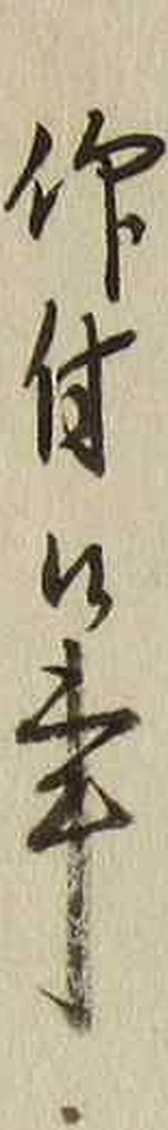仰付候事
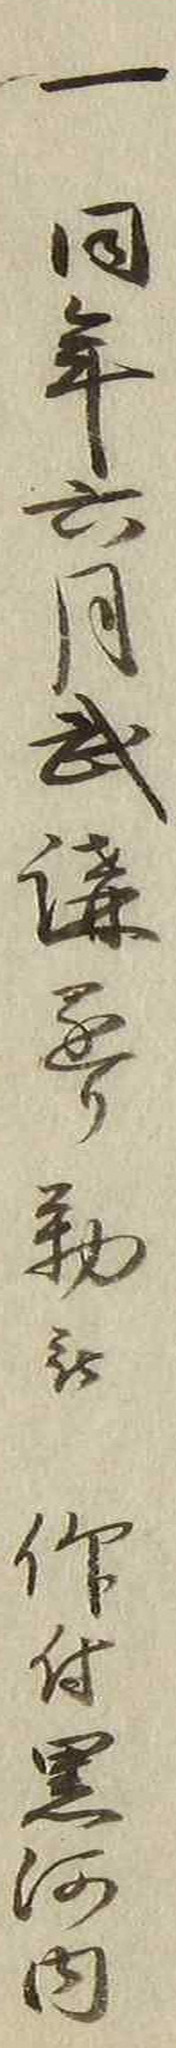一同年六月武講懸り勤被仰付黒河内
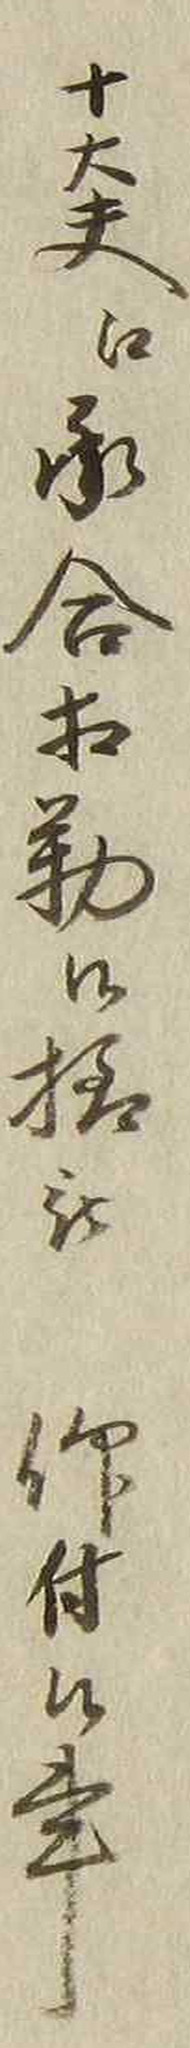十太夫江承合相勤候様被仰付候事
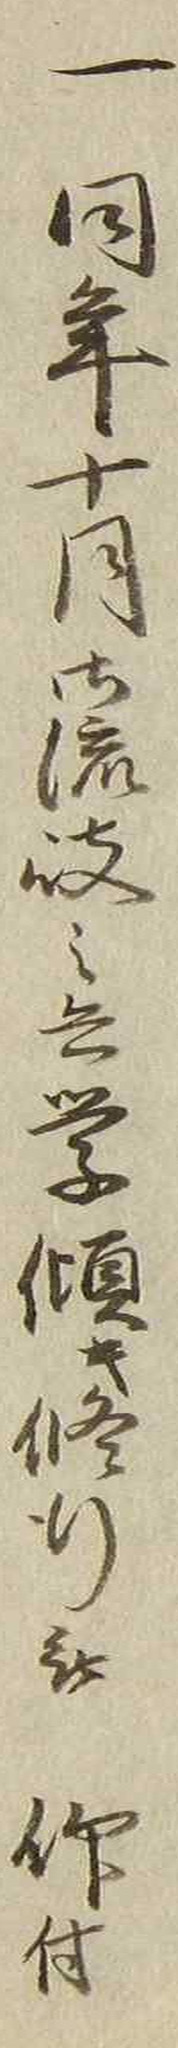一同年十月御流岐之兵学傾き修行被仰付
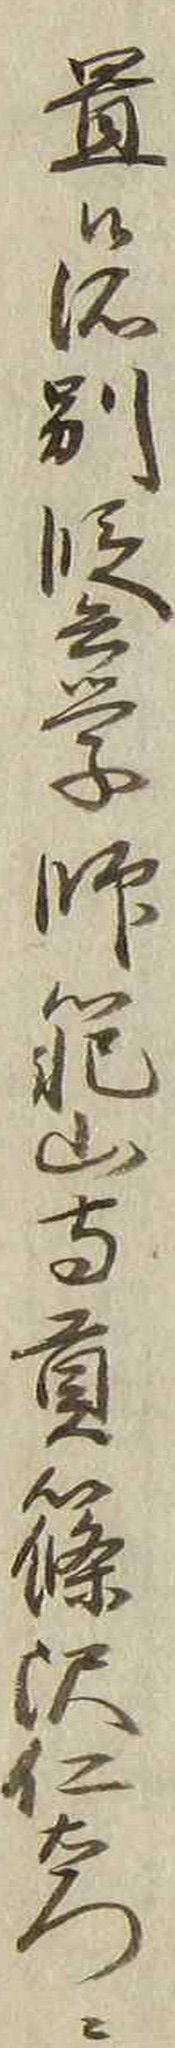置候所別段兵学師範山寺貢篠沢仁右衛門に

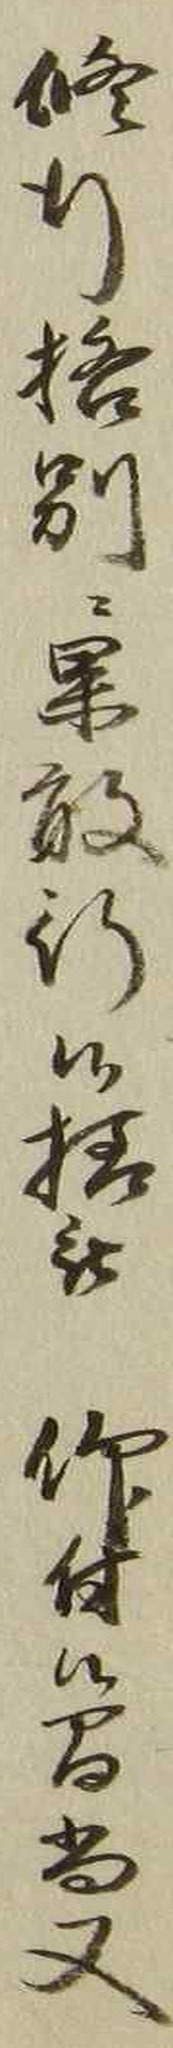修行格別に果般行候様被仰付候間尚又
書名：諸士系譜　巻之133　た之部9
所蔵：会津若松市立会津図書館
